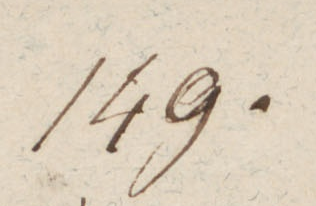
149.
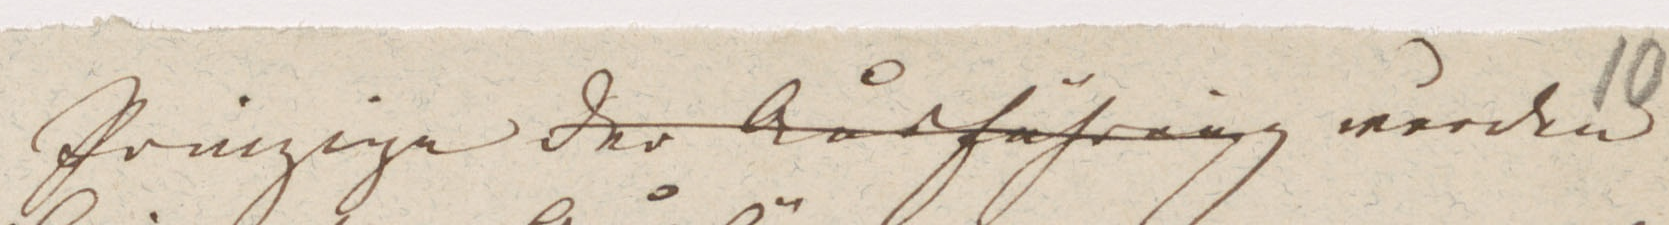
Prinzipe der Ausführung wurden
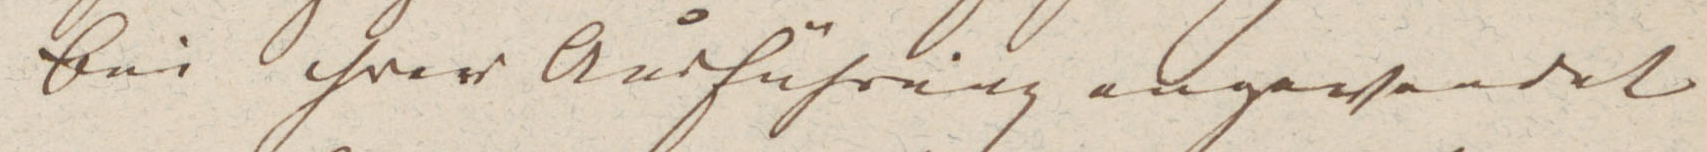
bei ihrer Ausführung angewendet
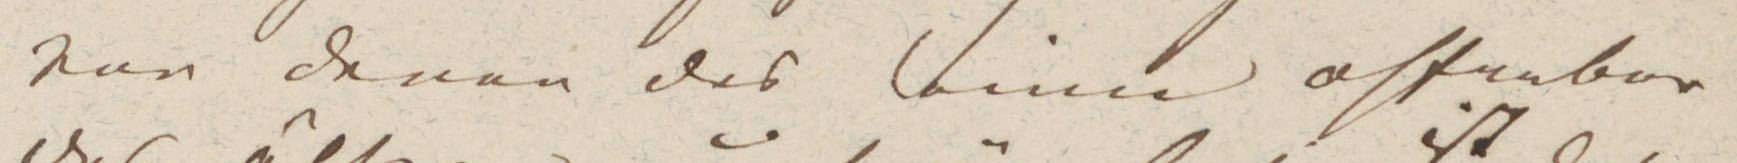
von denen das eine offenbar
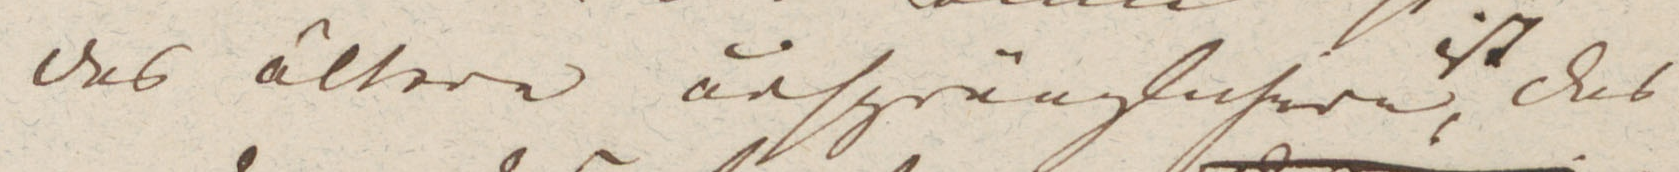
das ältere ursprünglichere ist, das
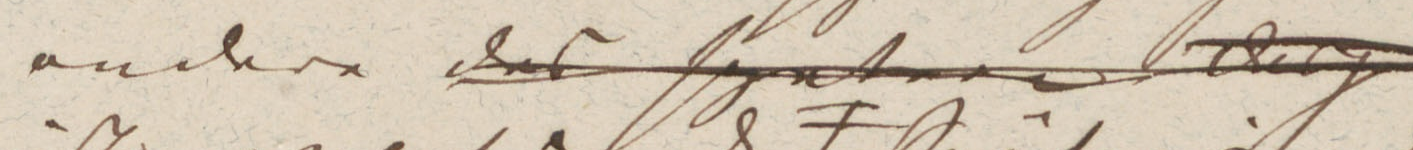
andere das spatere dasjenige
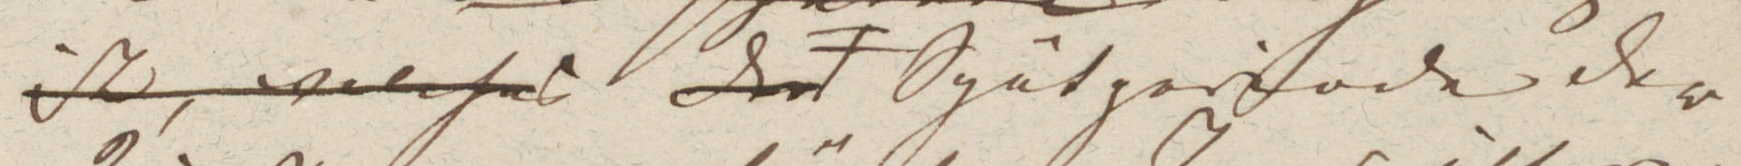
ist, welches der % Spätperiode der
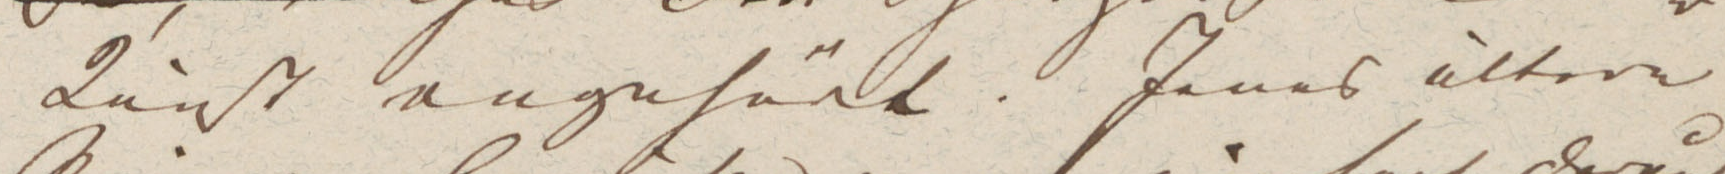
Kunst angehört. Jenes ältere
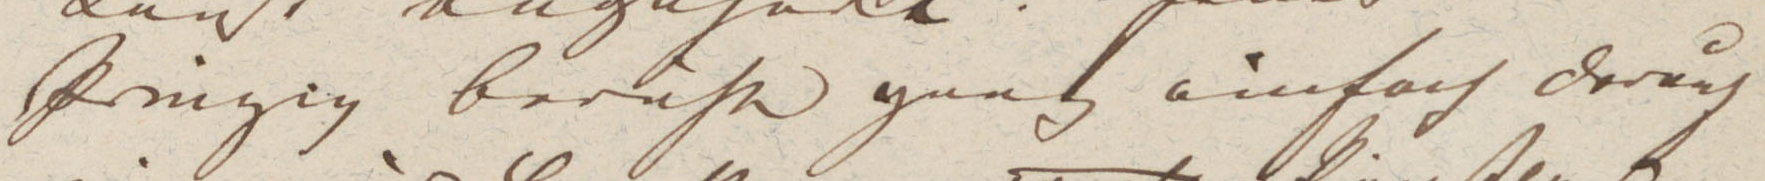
Prinzip beruht ganz einfach darauf
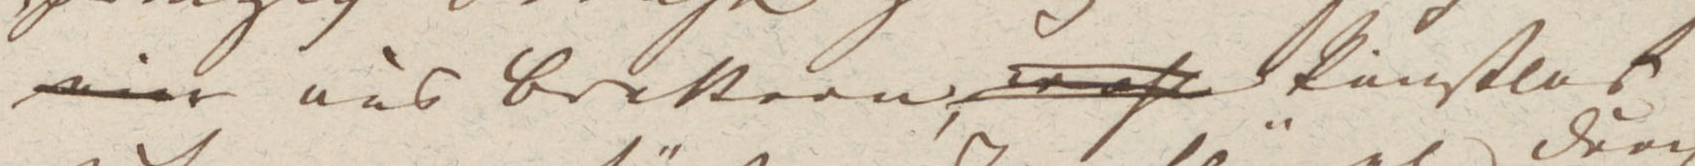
den ein aus Brettern, wohl kunstlos
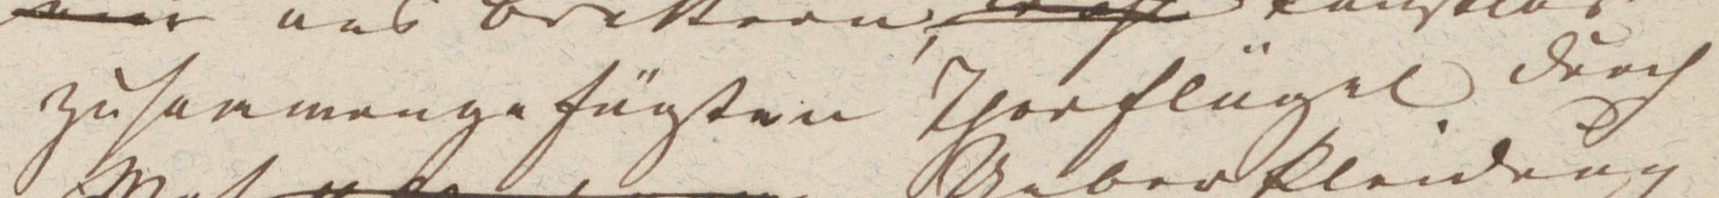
zusammengefügten Thorflügel durch
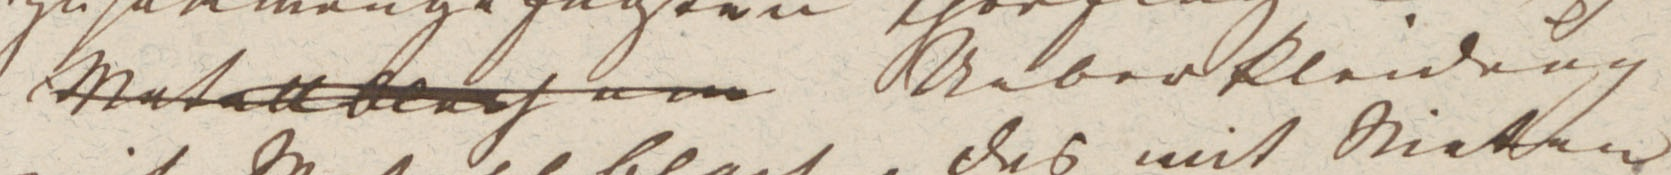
Metallblech ein Ueberkleidung
